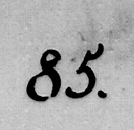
1. d.
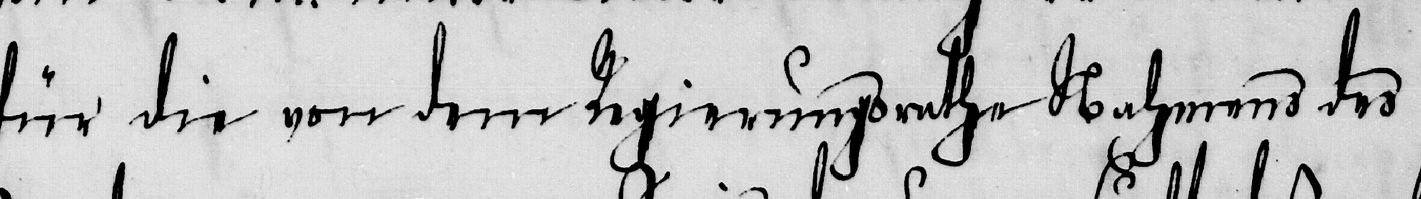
für die von dem Regierungsrathe Nahmens des
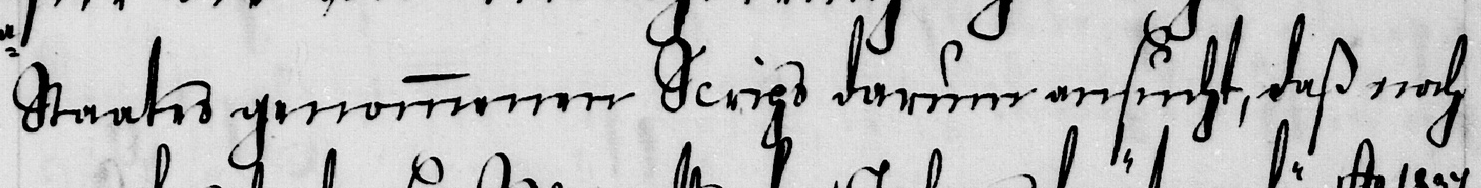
Staates genommenen Scrips darum ansucht, daß noch
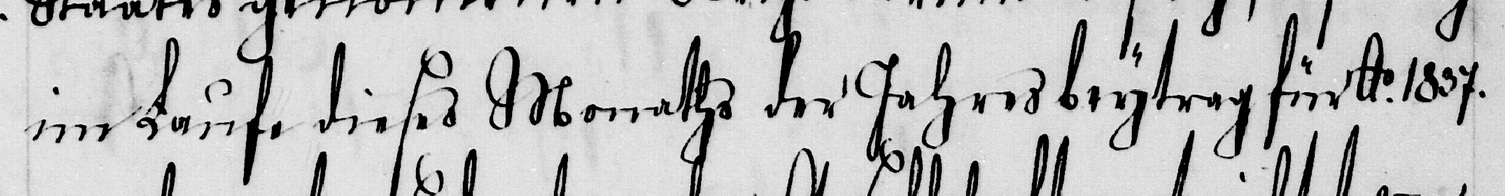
im Laufe dieses Monaths der Jahresbeytrag für Ao.
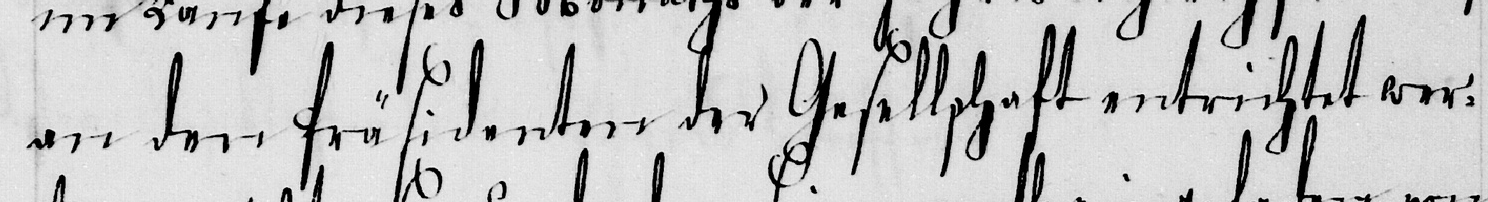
an den Präsidenten der Gesellschaft entrichtet we¬
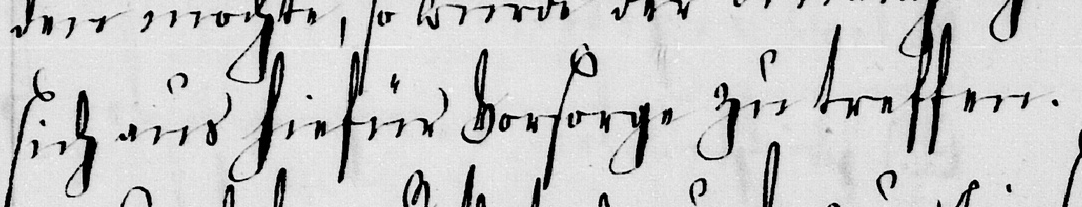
sich aus hiefür Vorsorge zu treffen.
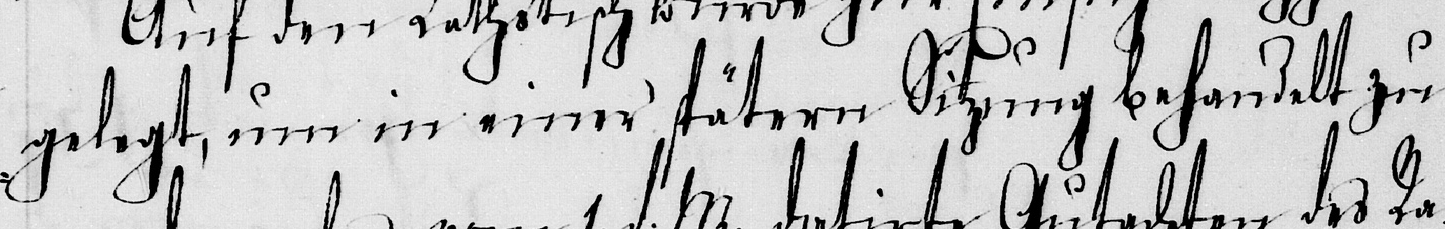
gelegt, um in einer spätern Sitzung behandelt zu
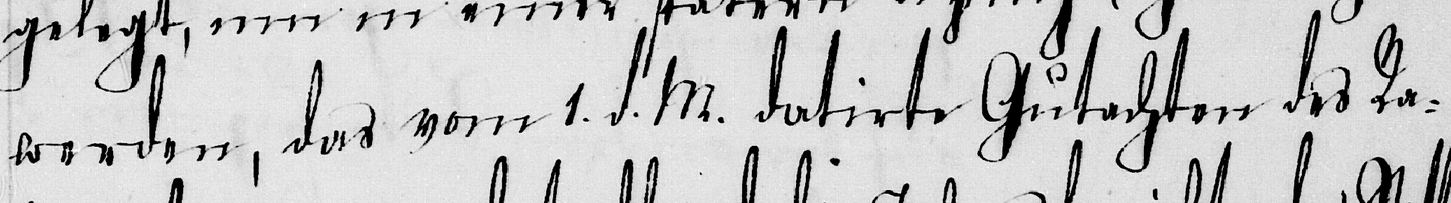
werden, das vom 1. d. M. datirte Gutachten des Ra¬
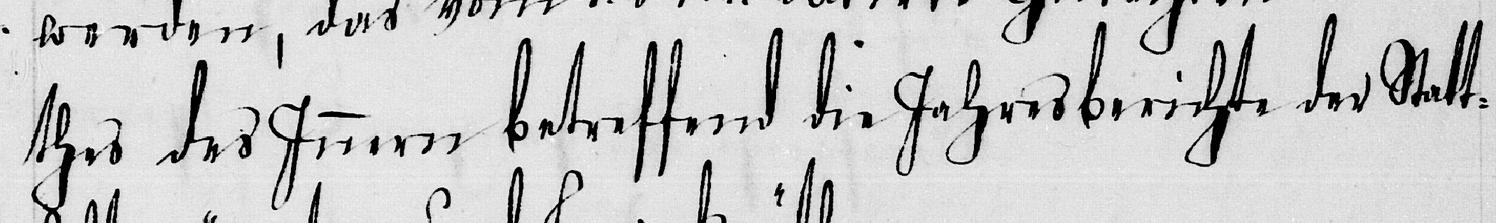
thes des Innern betreffend die Jahresberichte der Stat¬
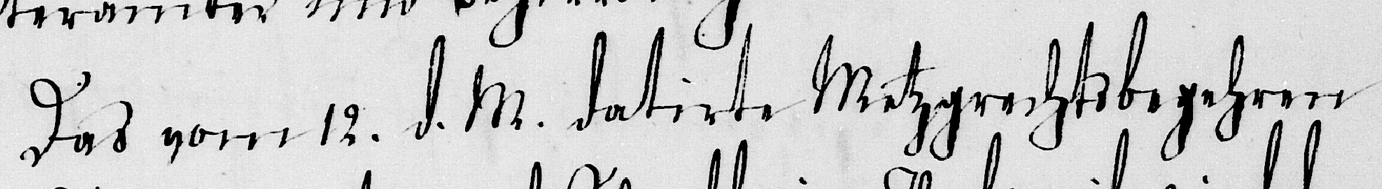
Das vom 12. d. M. datirte Metzgrechtsbegehren
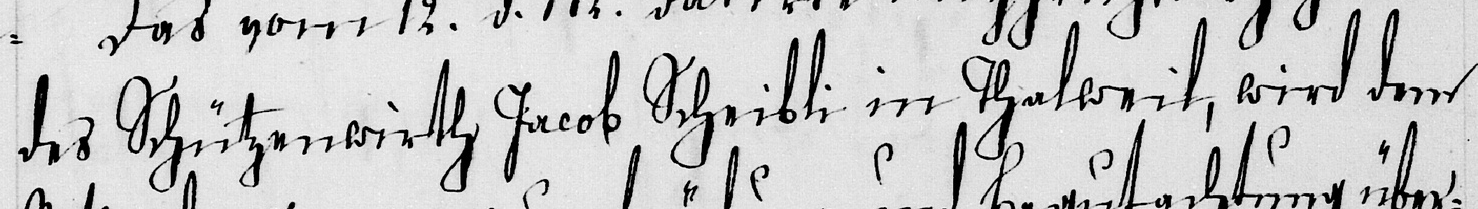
des Schützenwirth Jacob Scheibli in Thalweil, wird dem
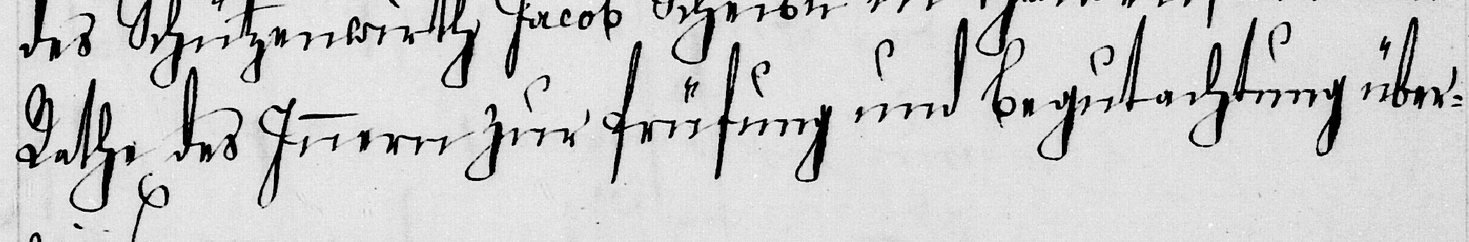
Rathe des Innern zur Prüfung und Begutachtung über¬
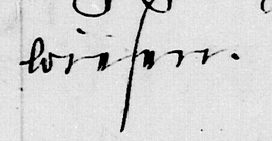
wiesen.
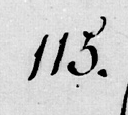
1837.
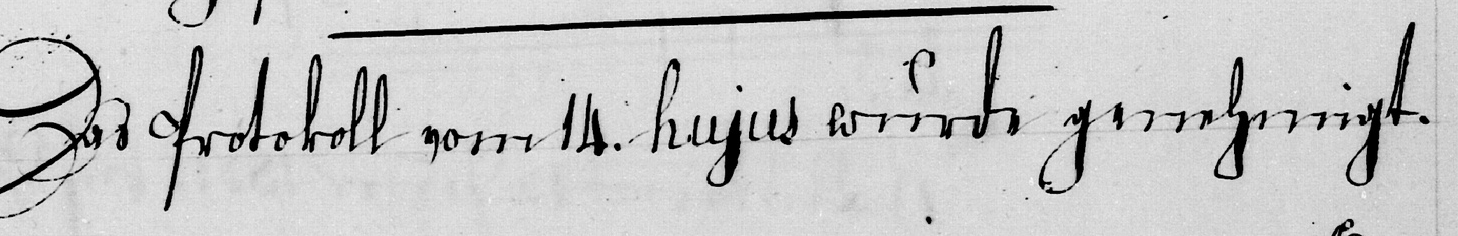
Das Protokoll vom 14. hujus wurde genehmigt.
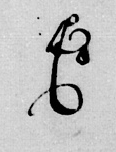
M.
